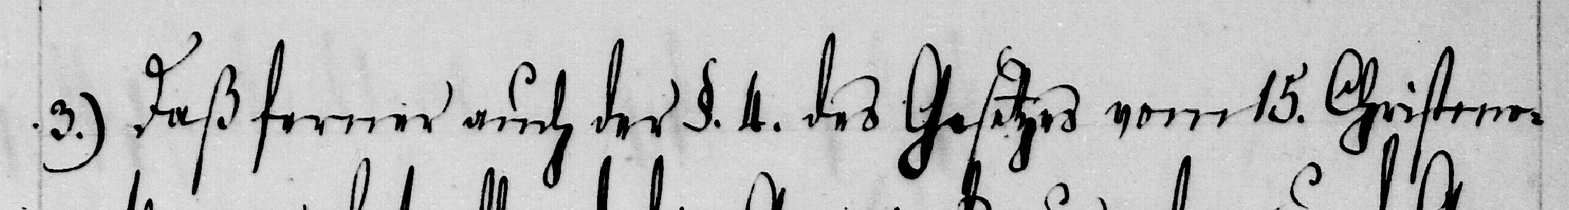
3.) Daß ferner auch der §. 4. des Gesetzes vom 15. Christmo¬
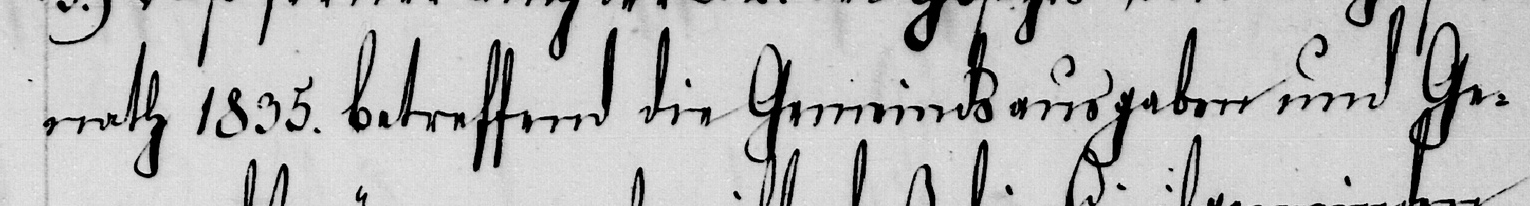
nath 1835. betreffend die Gemeindsausgaben und Ge¬
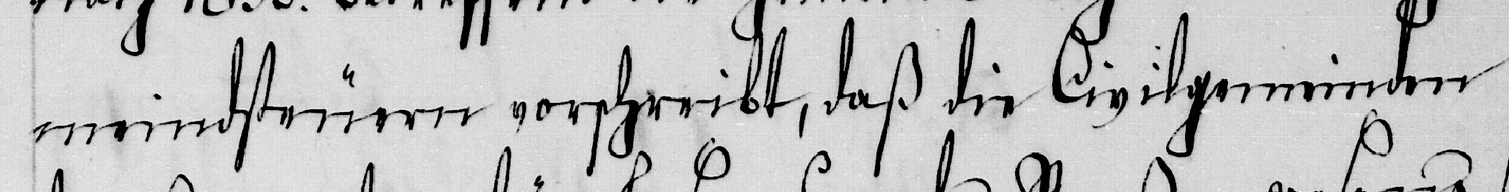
meindsteuern vorschreibt, daß die Civilgemeinden
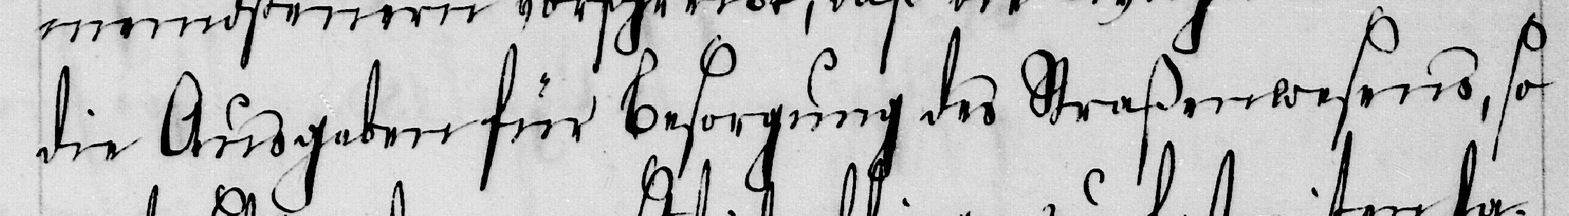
die Ausgaben für Besorgung des Straßenwesens, so
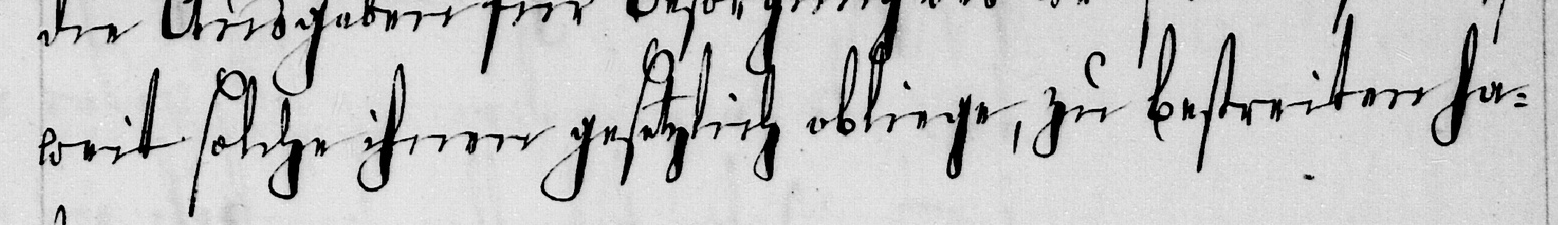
weit solche ihnen gesetzlich obliege, zu bestreiten ha¬
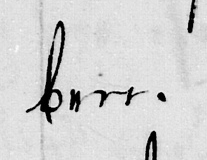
ben.
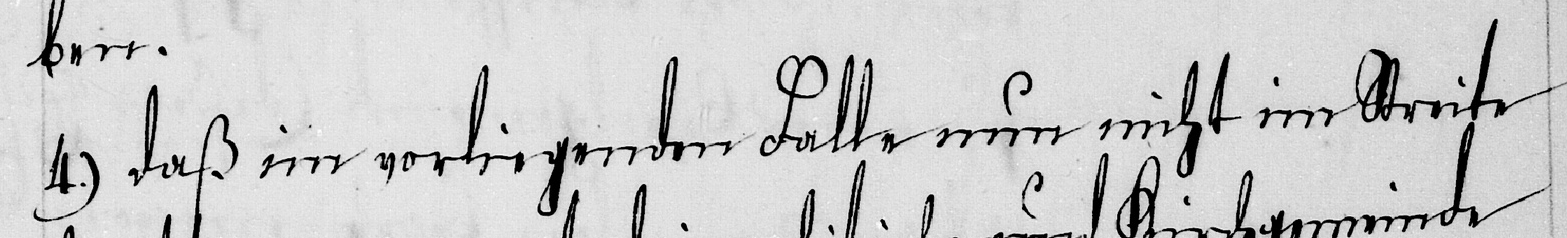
4.) daß im vorliegenden Falle nun nicht im Streite
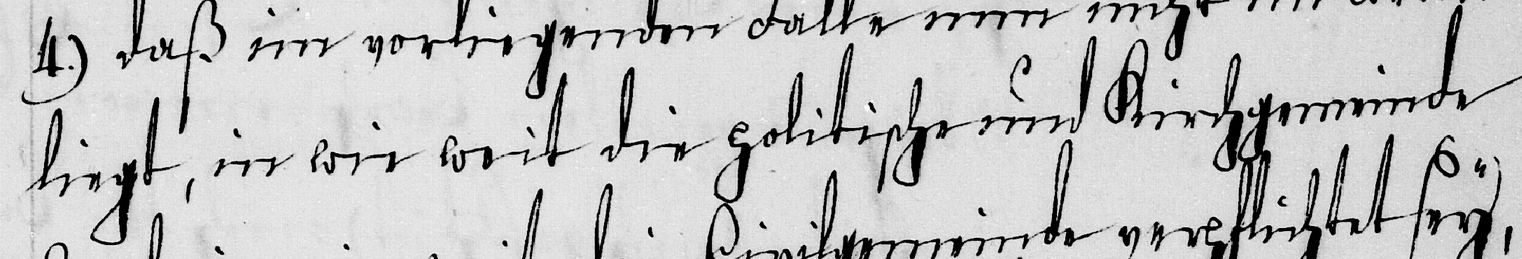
liegt, in wie weit die politische und Kirchgemeinde
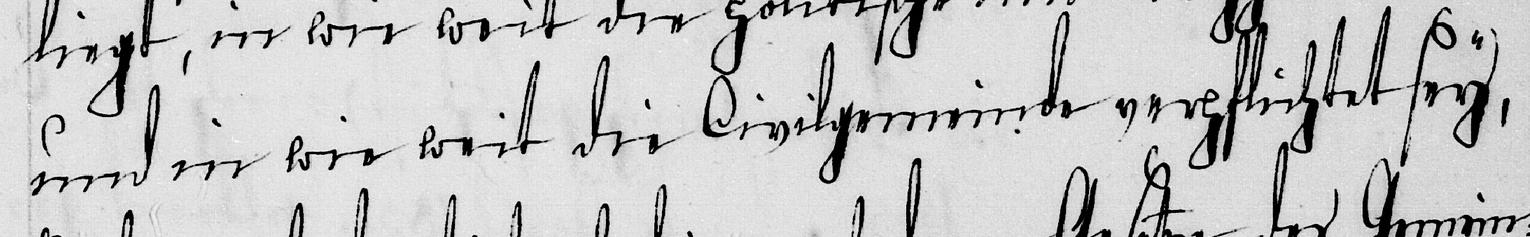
und in wie weit die Civilgemeinde verpflichtet sey,
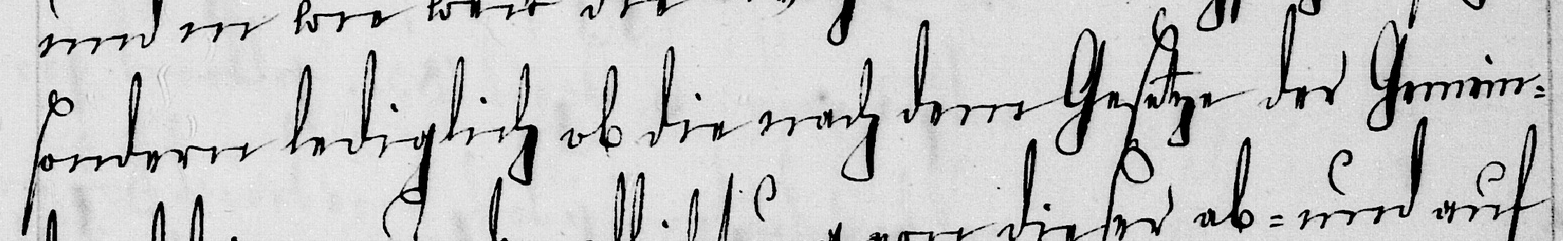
sondern lediglich ob die nach dem Gesetze der Gemein¬
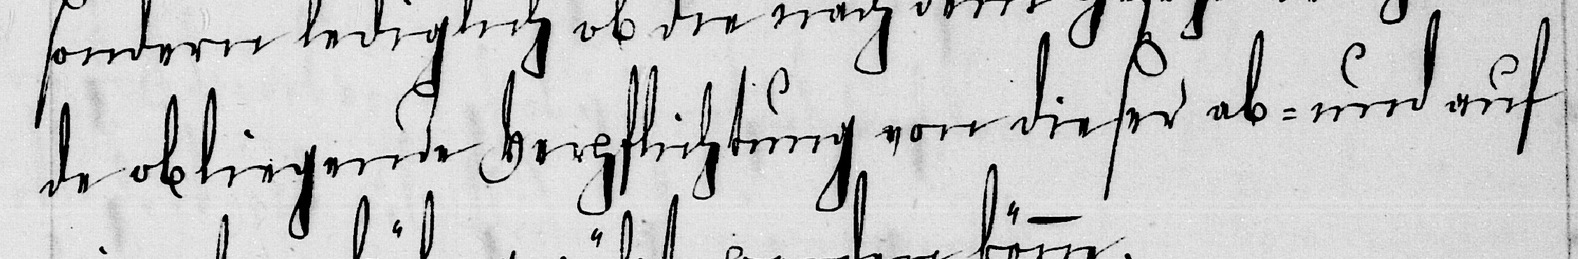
de obliegende Verpflichtung von dieser ab- und auf
